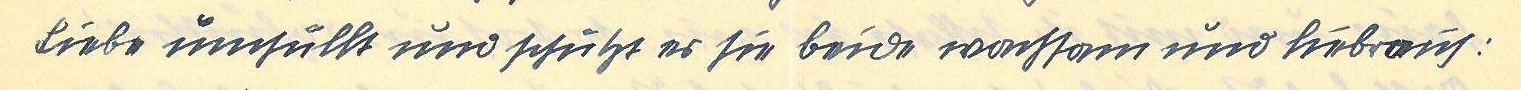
Liebe umhüllt und schützt er sie beide wachsam und liebreich:
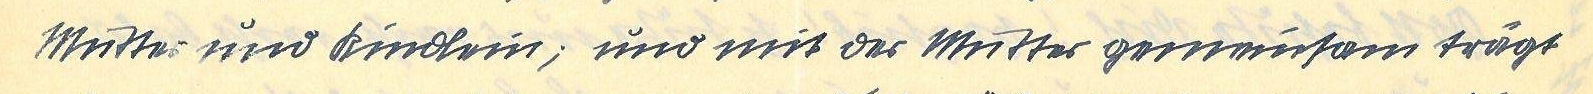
Mutter und Kindlein; und mit der Mutter gemeinsam trägt
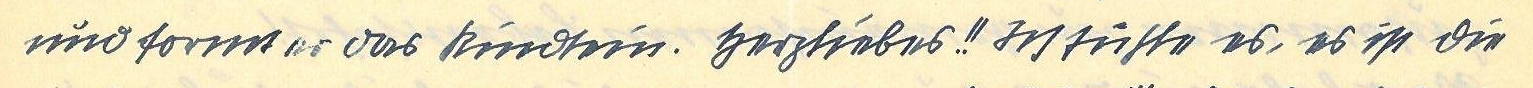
und formt er das Kindlein. Herzliebes!! Ich fühle es, es ist die
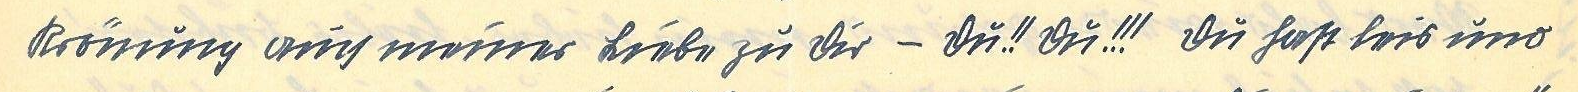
Krönung auch meiner Liebe zu Dir – Du!! Du!!! Du hast leis und
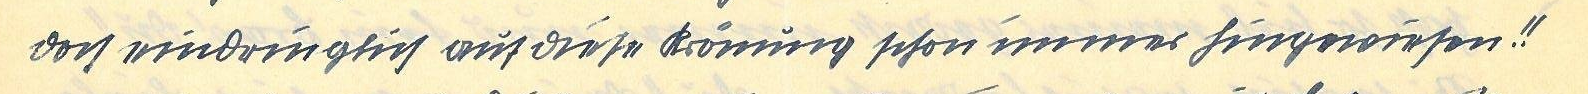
doch eindringlich auf diese Krönung schon immer hingewiesen!!
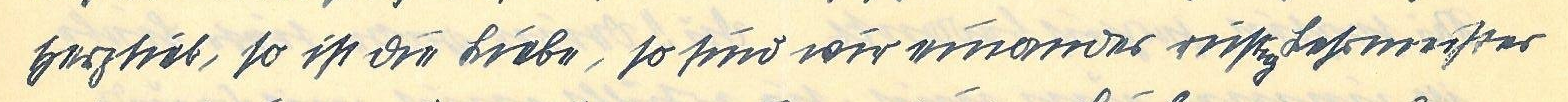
Herzlieb, so ist die Liebe, so sind wir einander richtig Lehrmeister
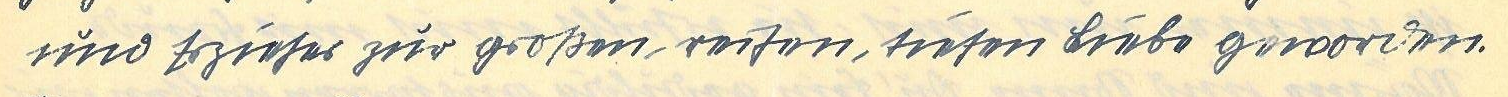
und Erzieher zur großen, reifen, tiefen Liebe geworden.
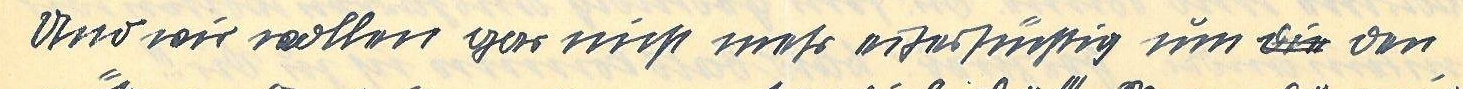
Und wir wollen gar nicht mehr eifersüchtig um die den
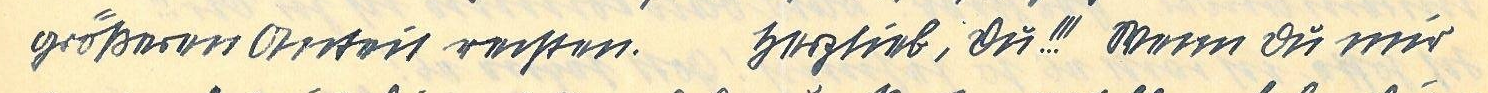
größeren Anteil rechten. Herzlieb, Du!!! Wenn Du mir
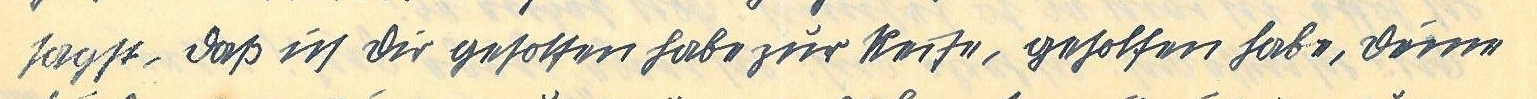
sagst, daß ich Dir geholfen habe zur Reife, geholfen habe, Deine
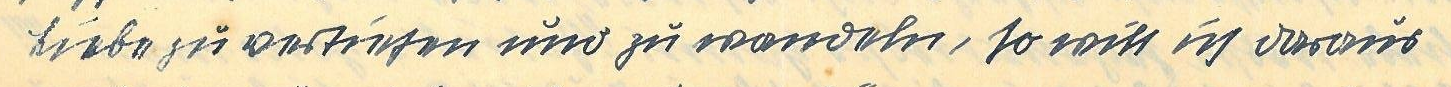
Liebe zu vertiefen und zu wandeln, so will ich daraus
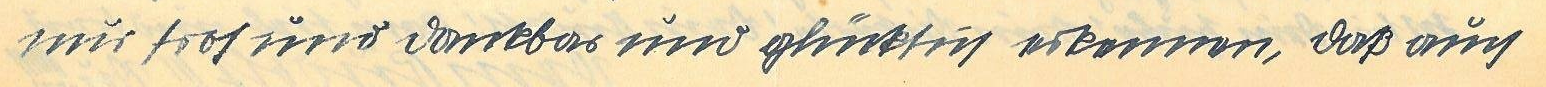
nur froh und dankbar und glücklich erkennen, daß auch
